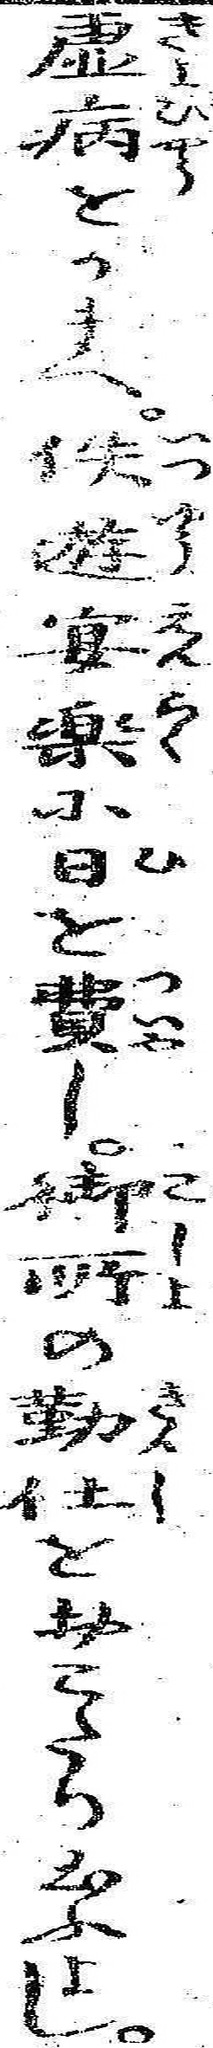虚病をかまへ。佚遊宴楽に日を費し。御所の勤仕をおこたり玉ふよし。
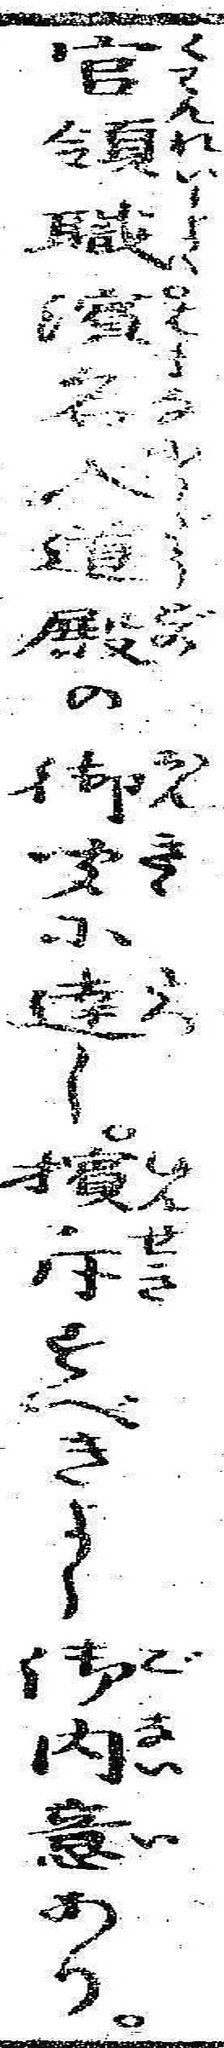官領職。浜名入道殿の御聞に達し。擯斥すべきよし御内意あり。
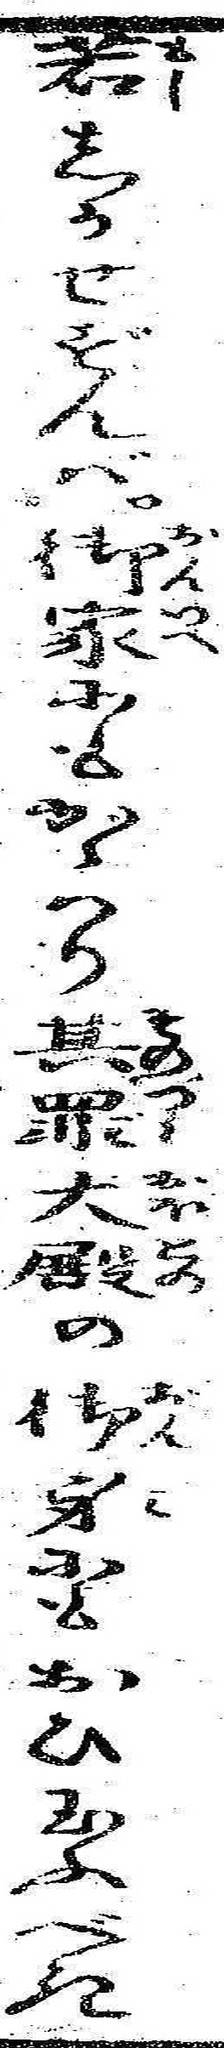若しかせずんば。御家にもかゝはり其罪大殿の御身にもおひ玉ふべき
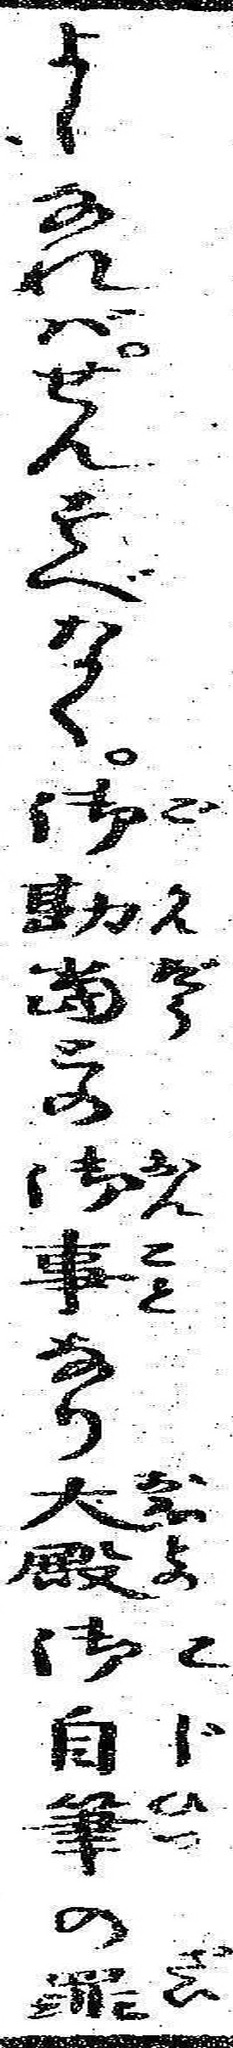よしなれば。せんすべなく。御勘当との御事なり大殿御自筆の罪
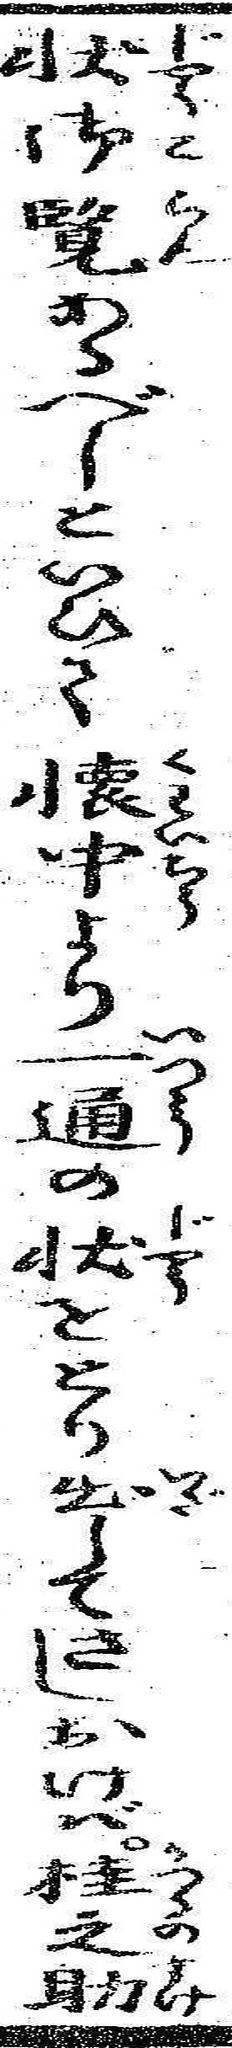状御覧あるべしといひて懐中より一通の状をとり出してさしおけば。桂之助
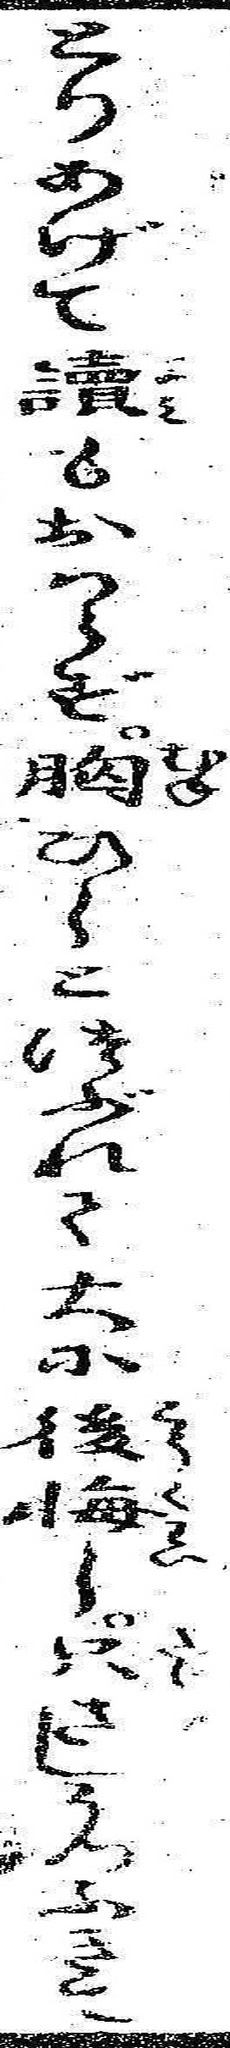とりあげて読もおはらず。胸ひしとつぶれて大に後悔し。只さしうつふきて
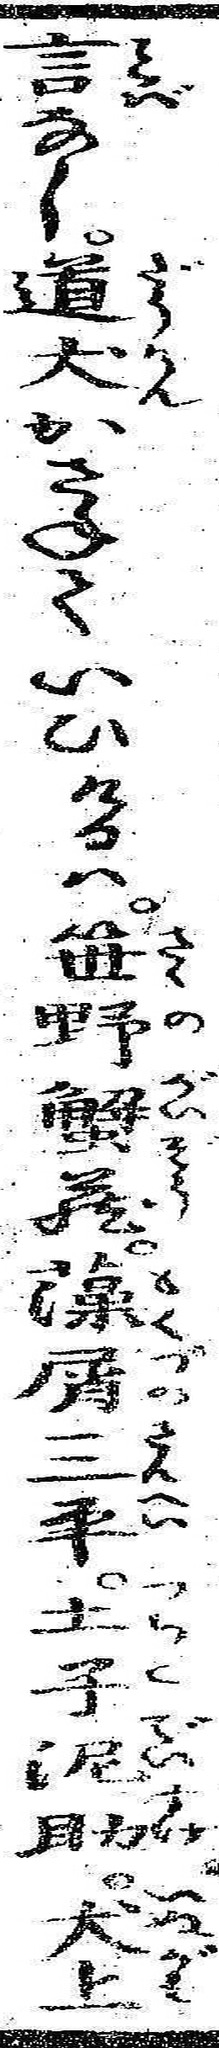言なし。道犬かさねていひけるは。笹野蟹蔵。藻屑三平。土子泥助。犬上
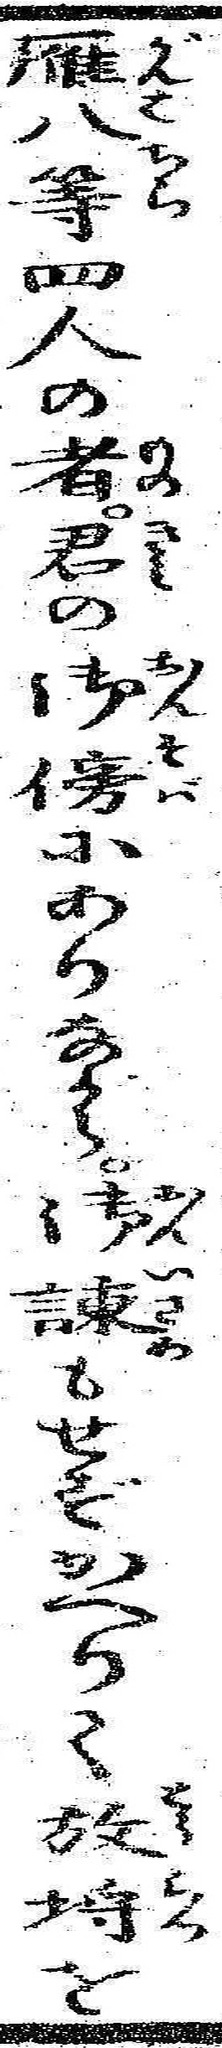雁八等四人の者。君の御傍にありなから。御諌もせずかへりて放埒を
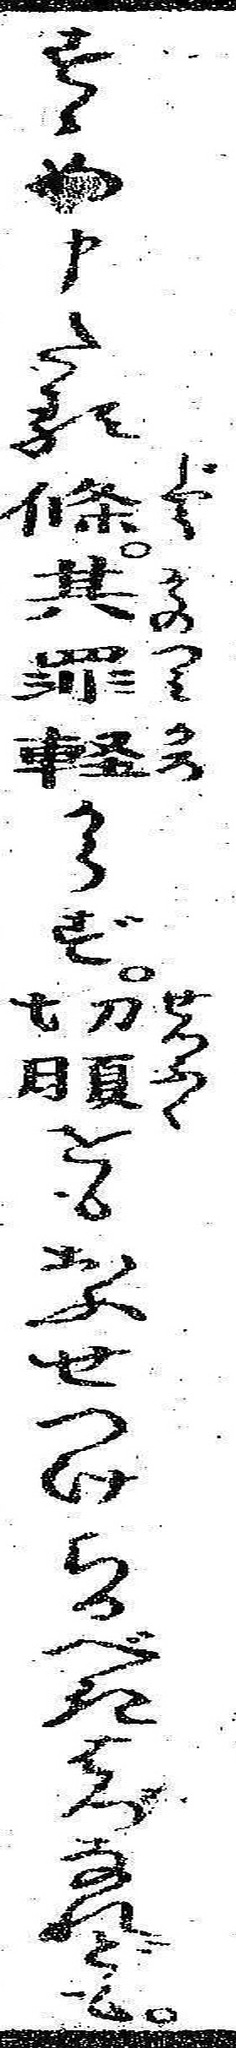すゝめ申たる条。其罪軽からず。切腹をもおふせつけらるべきはづなれども。
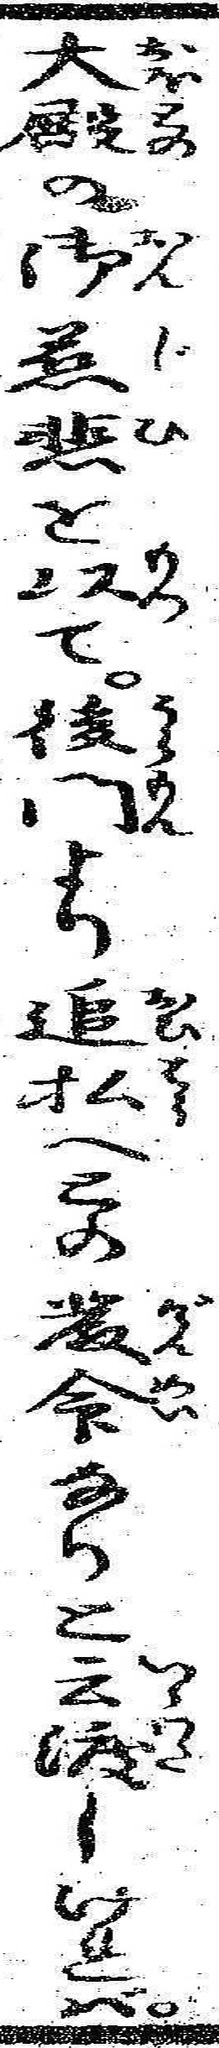大殿の御慈悲を以て。後門より追払へとの厳命なりと云渡しければ。
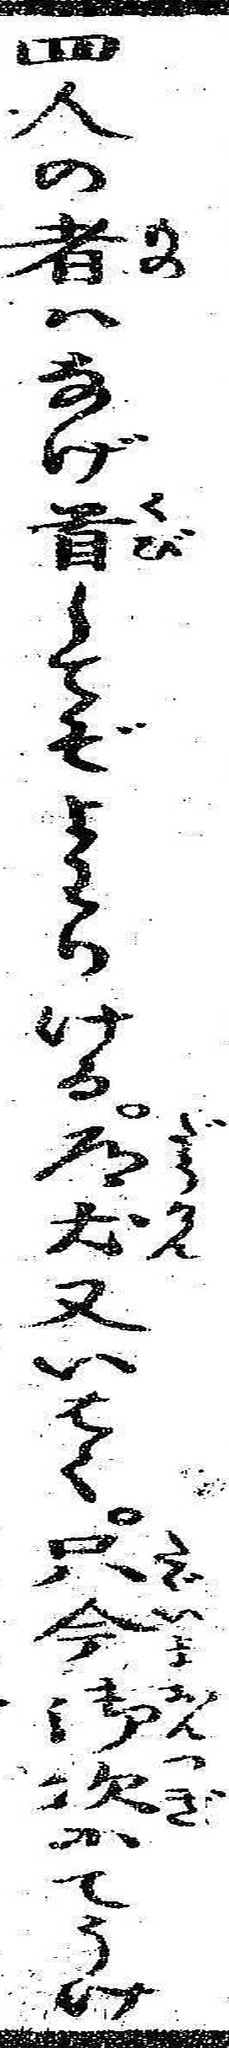四人の者はなげ首してぞよわりける。道犬又いはく。只今御次にてうけ
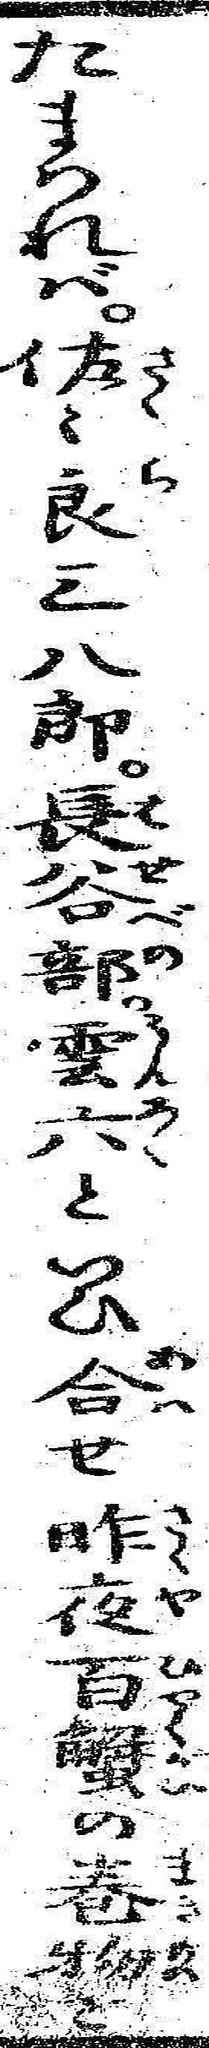たまはれば。佐々良三八郎。長谷部。雲六といひ合せ昨夜百蟹の巻物を
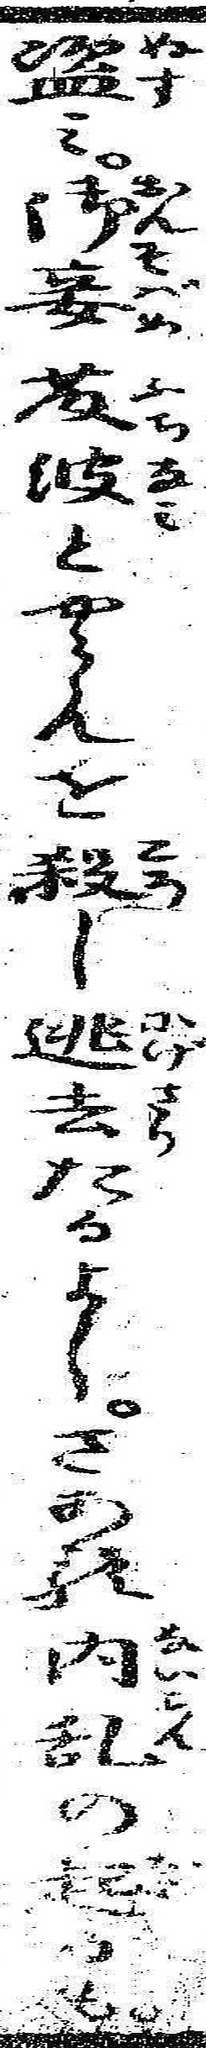盗み。御妾藤波とやらんを殺し逃去たるよし。さある内乱の起るも。
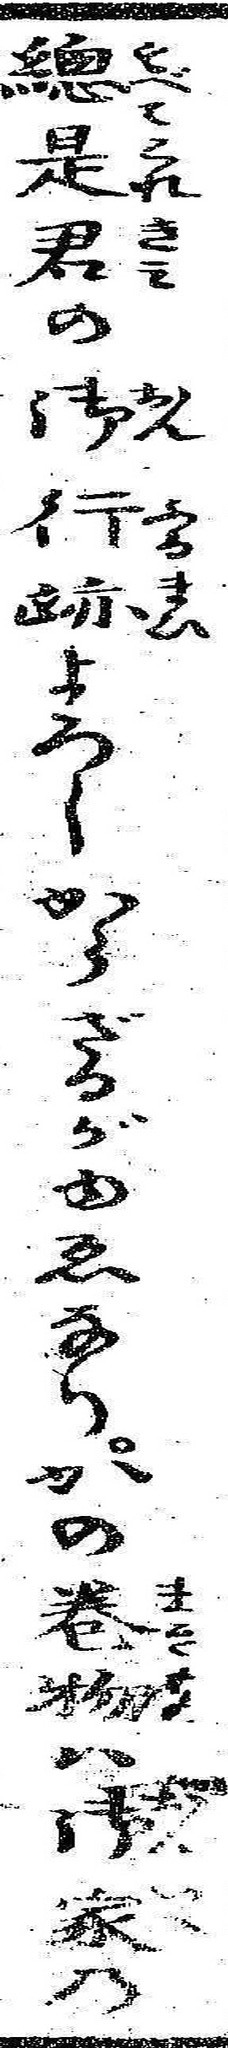総是君の御行跡よろしからざるがゆゑなり。かの巻物は御家の

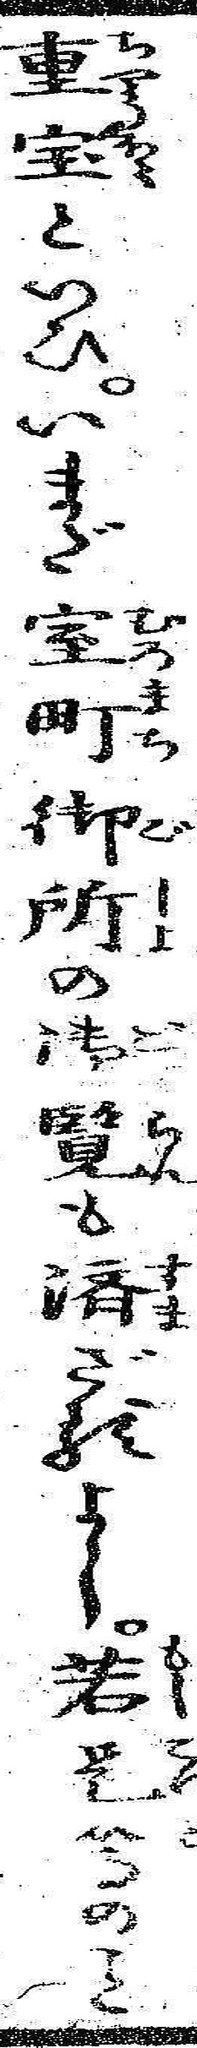重宝といひ。いまだ室町御所の御覧も済ざるよし。若是等のこと
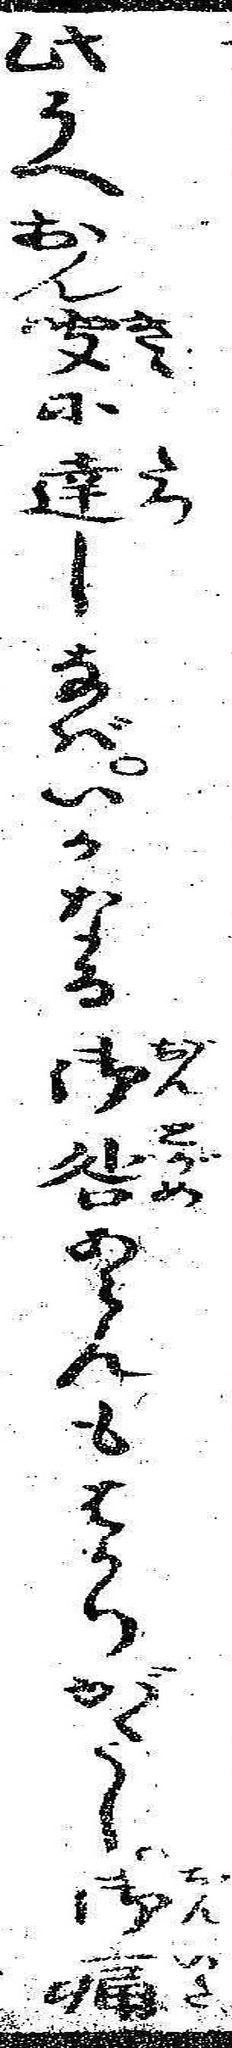此うへおん聞に達しなば。いかなる御咎あらんもはかりがたし。御痛
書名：昔話稲妻表紙
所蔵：国文学研究資料館
